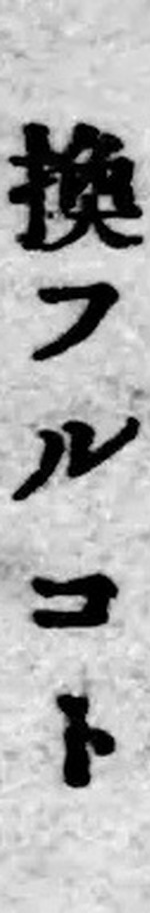換フルコト
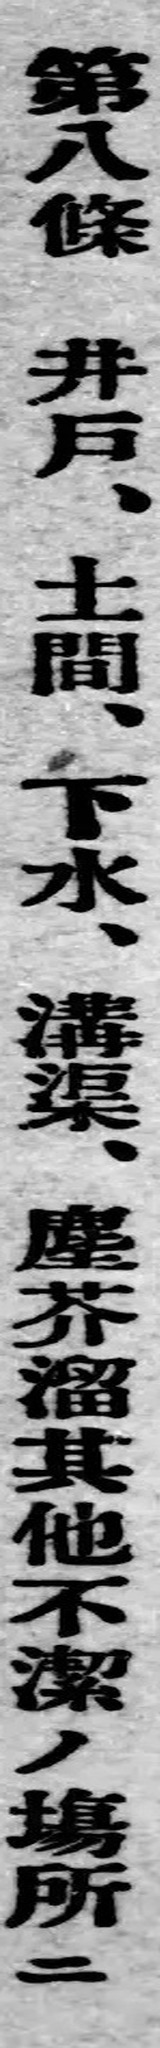第八条井戸、土間、下水、溝渠、塵芥溜其他不潔ノ塲所ニ
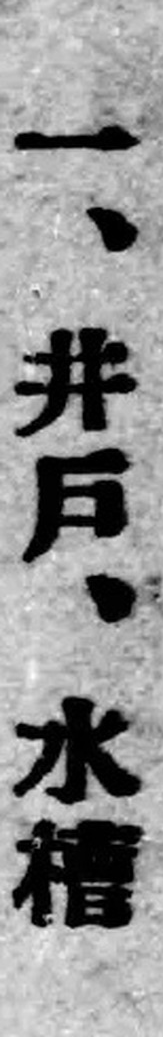一、井戸、水槽
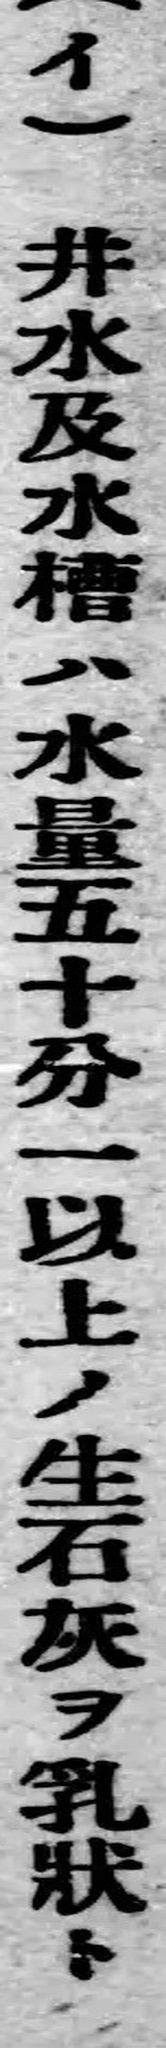(イ)井水及水槽ハ水量五十分一以上ノ生石灰ヲ乳狀ト
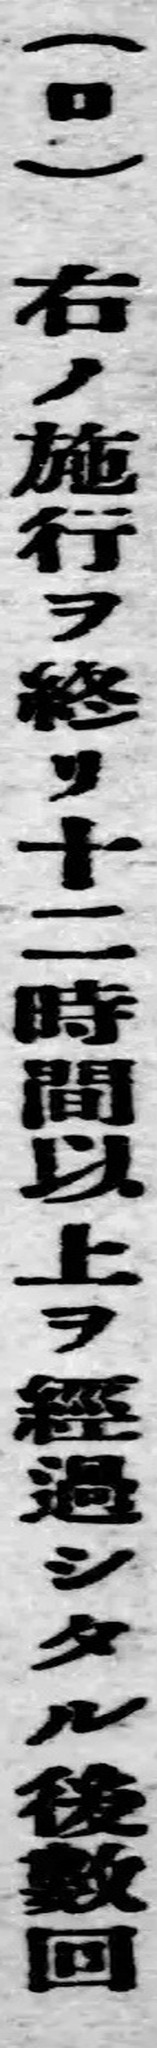(ロ)右ノ施工ヲ終リ十二時間以上ヲ經過シタル後數回
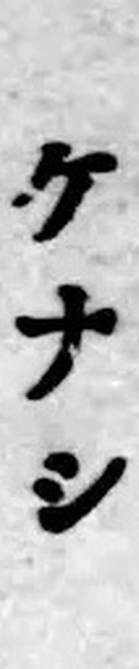ケナシ
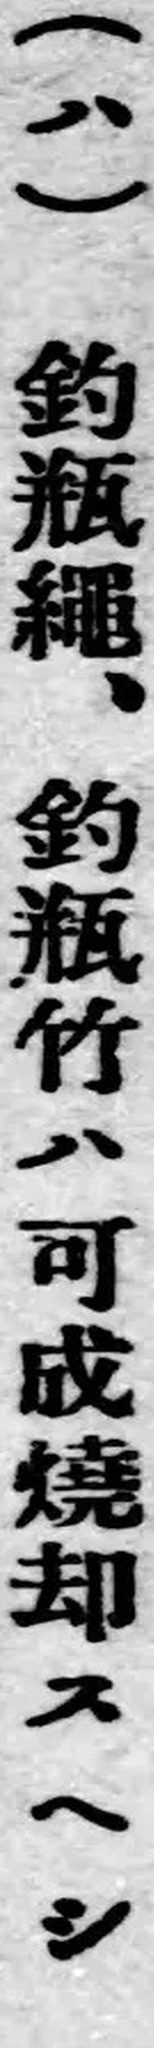(ハ)釣瓶縄、釣瓶竹ハ可成燒却スヘシ
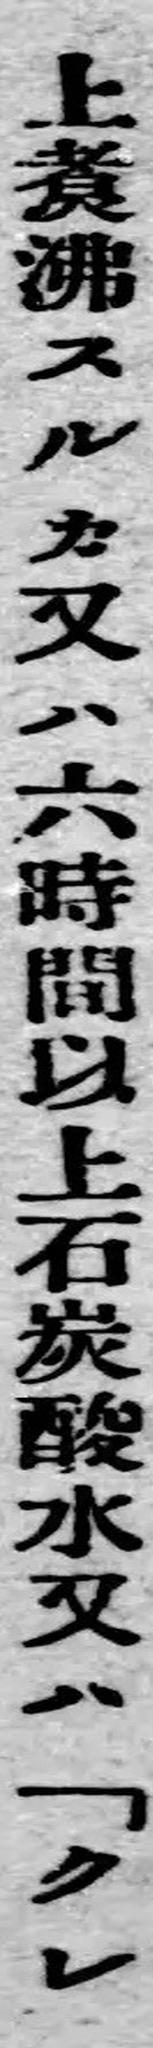上煑沸スルカ又ハ六時間以上石炭酸水又ハ「クレ
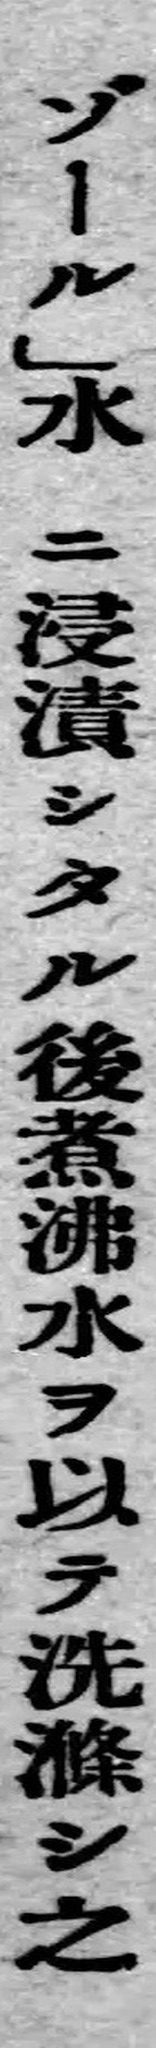ゾール」水ニ浸漬シタル後煮沸水ヲ以テ洗滌シ之

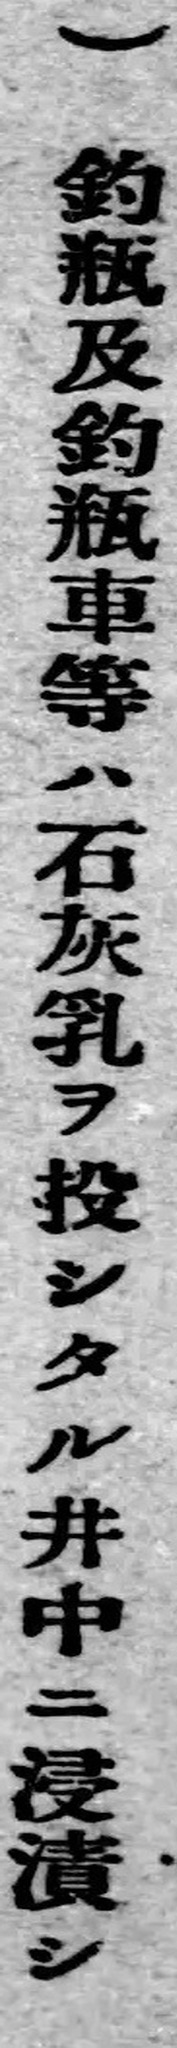(ニ)釣瓶及釣瓶車等ハ石灰乳ヲ投シタル井中ニ浸漬シ
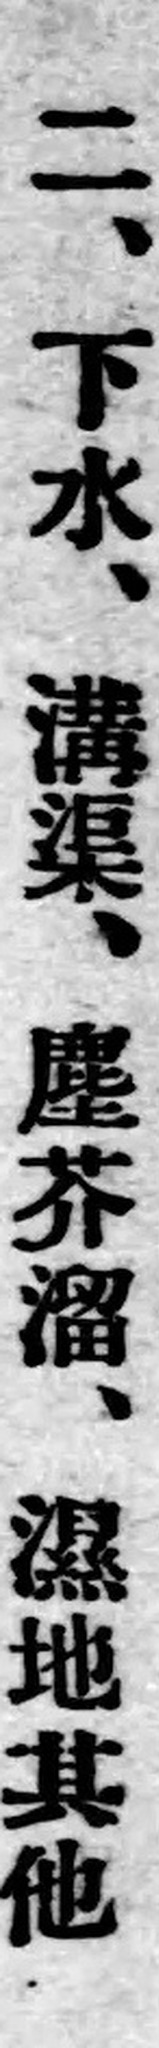二、下水、溝渠、塵芥溜、濕地其他
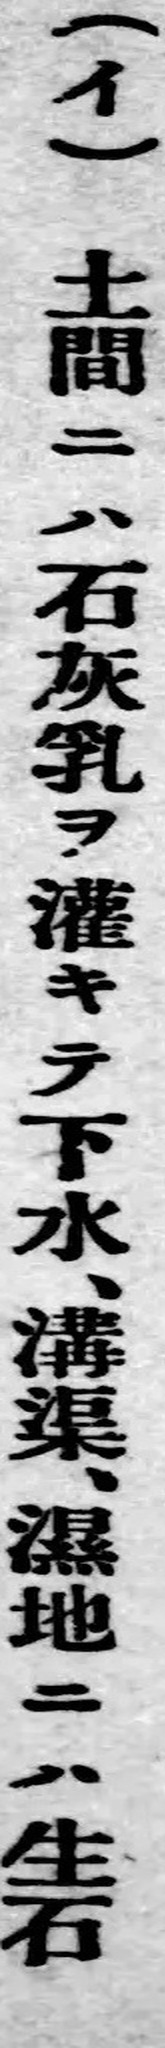(イ)土間ニハ石灰乳ヲ灌キテ下水、溝渠、濕地ニハ生石
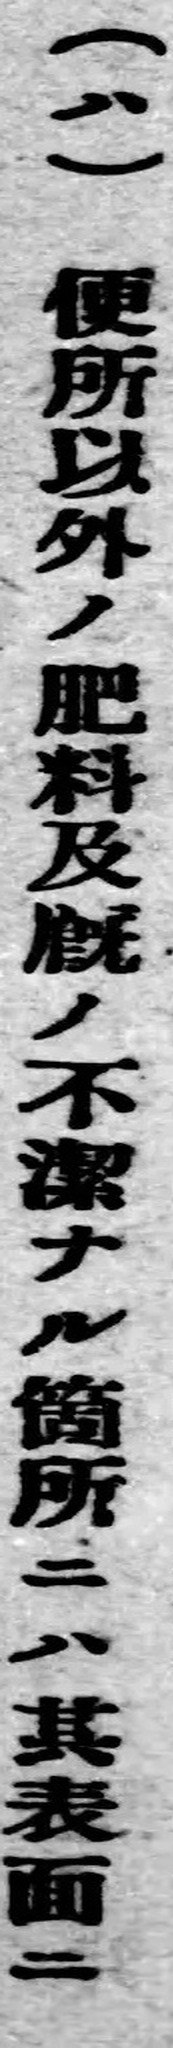(ハ)便所以外ノ肥料及厩ノ不潔ナル箇所ニハ其表面ニ
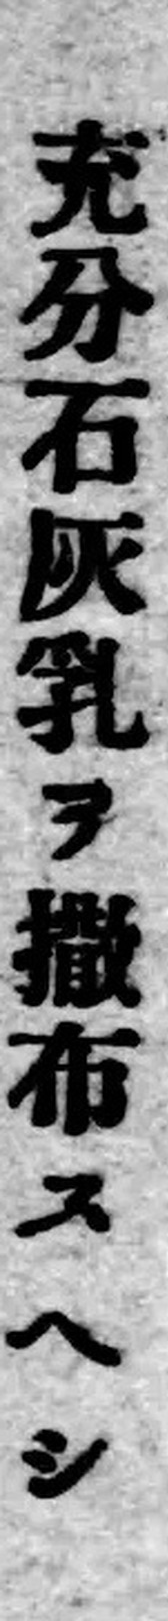充分石灰乳ヲ撒布スヘシ
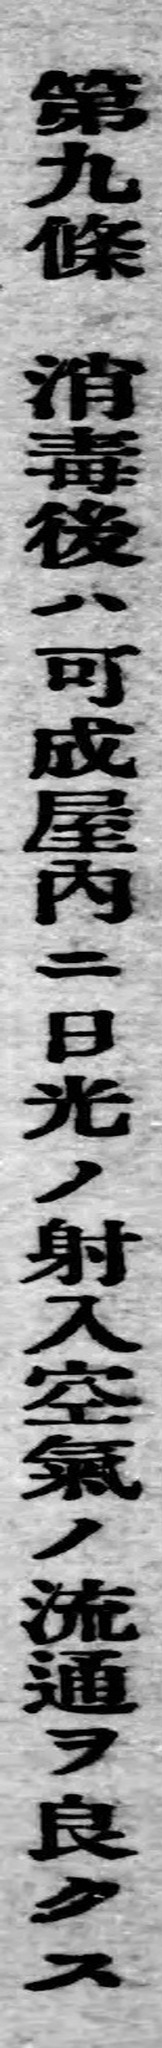第九條消毒後ハ可成屋内ニ日光ノ射入空氣ノ流通ヲ良クス
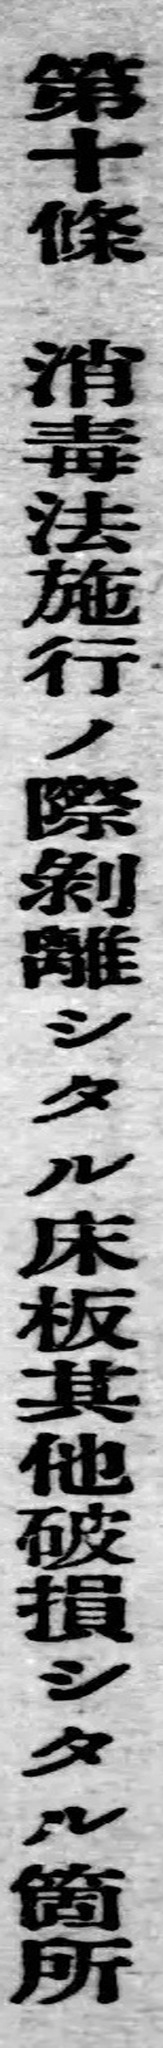第十條消毒法施行ノ際剝離シタル床板其他破損シタル箇所
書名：袖珍防疫必携
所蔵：国立国会図書館 National Diet Library, JAPAN
